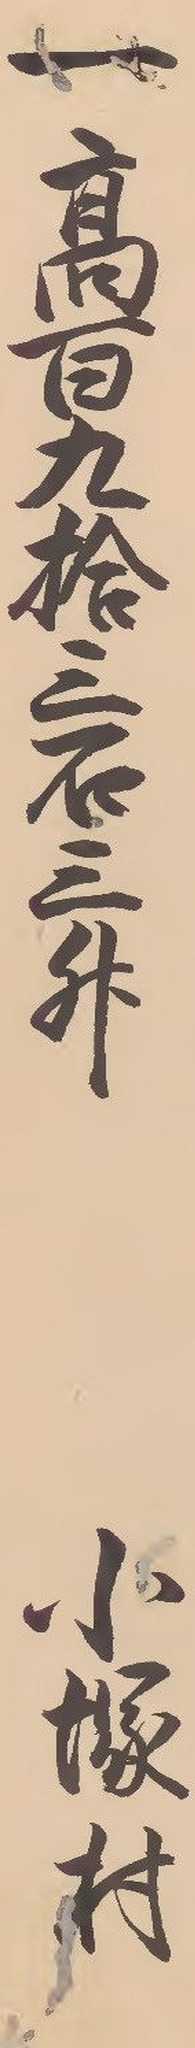一高百九拾三石三升小塚村

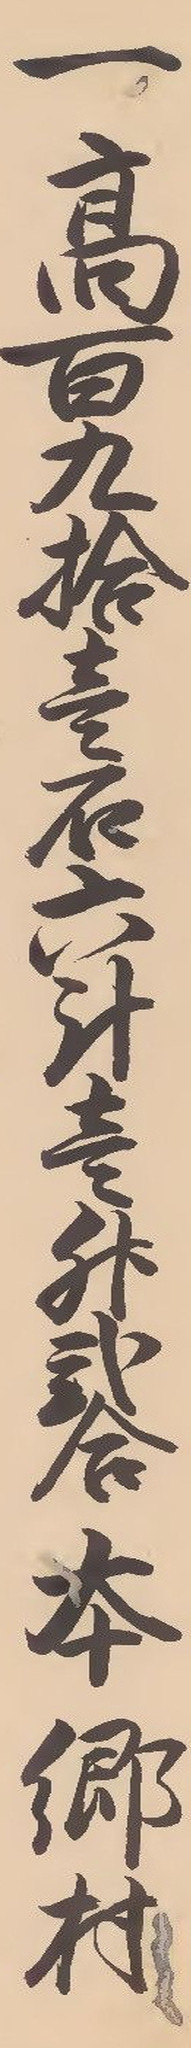一高百九拾壱石六斗壱升弐合本郷村
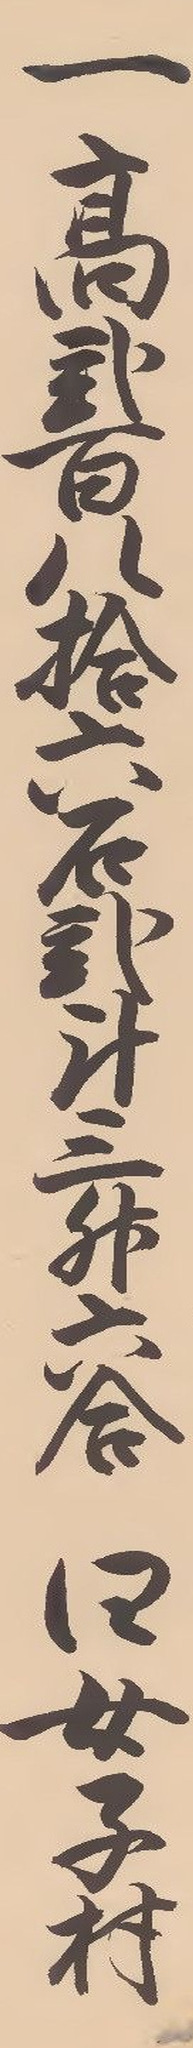一高弐百八拾六石弐斗三升六合四女子村
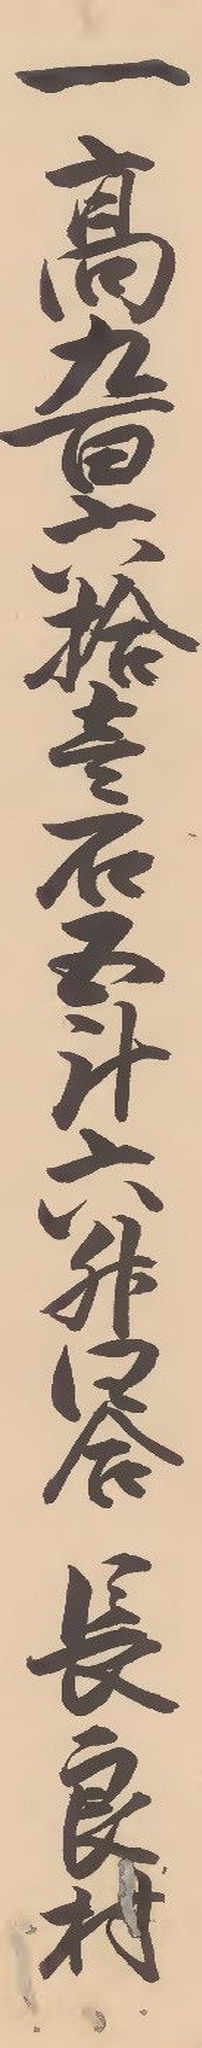一高九百六拾壱石五斗六升四合長良村
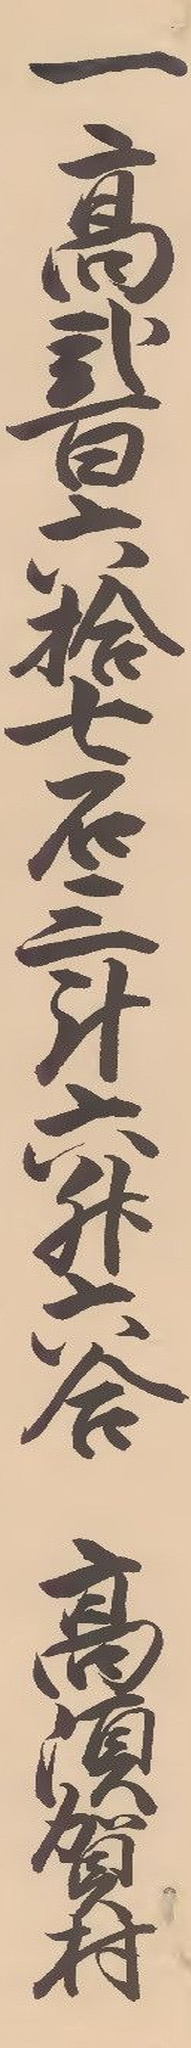一高弐百六拾七石三斗六升六合高須賀村
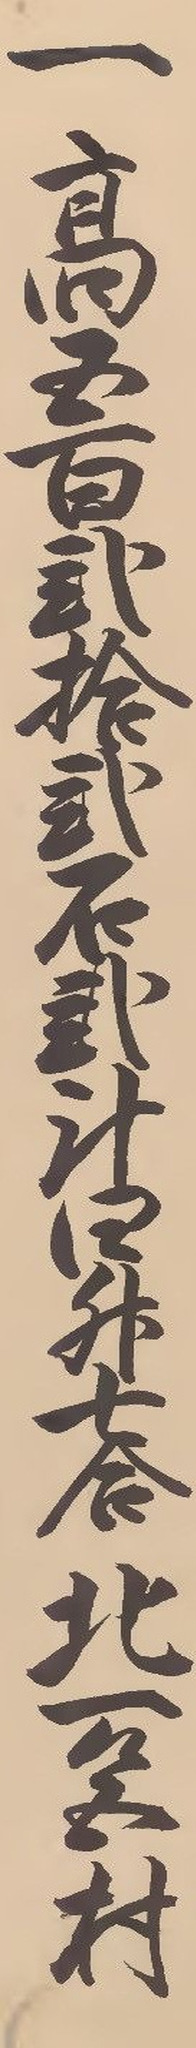一高五百弐拾弐石弐斗四升七合北一色村
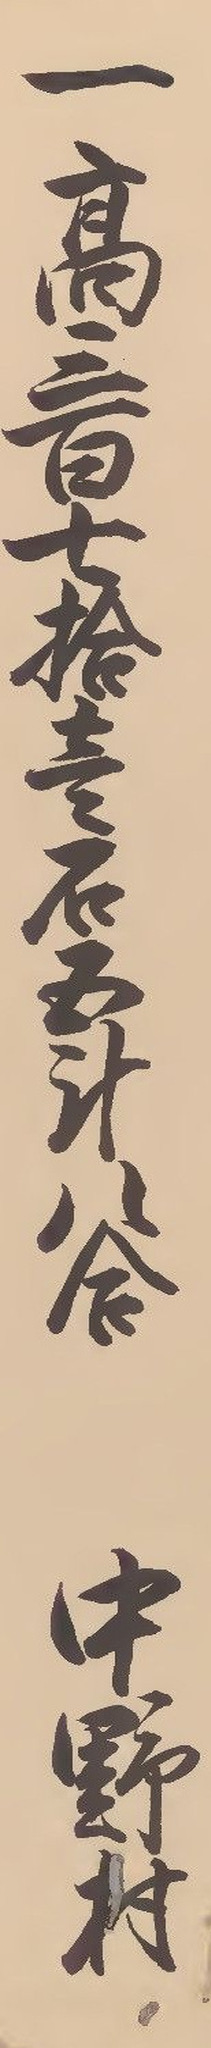一高三百七拾壱石五斗八合中野村
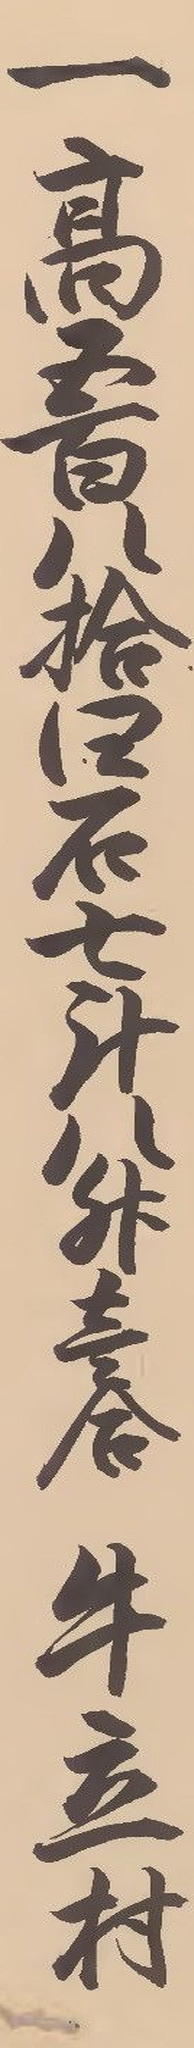一高五百八拾四石七斗八升壱合牛立村
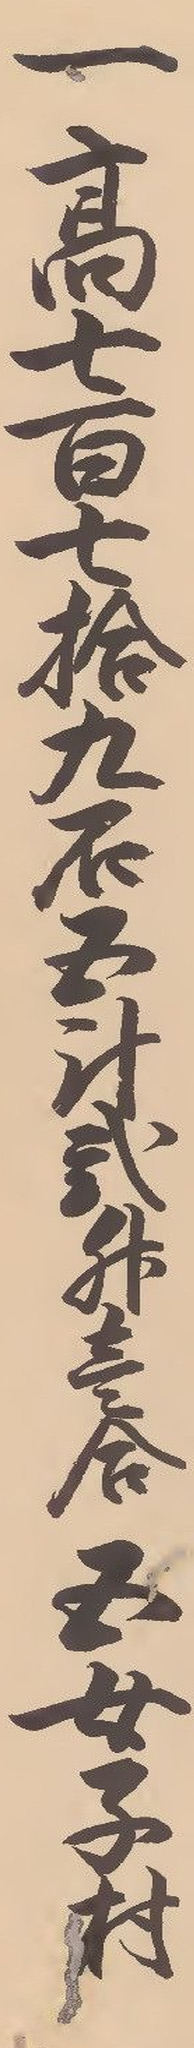一高七百七拾九石五斗弐升壱合五女子村

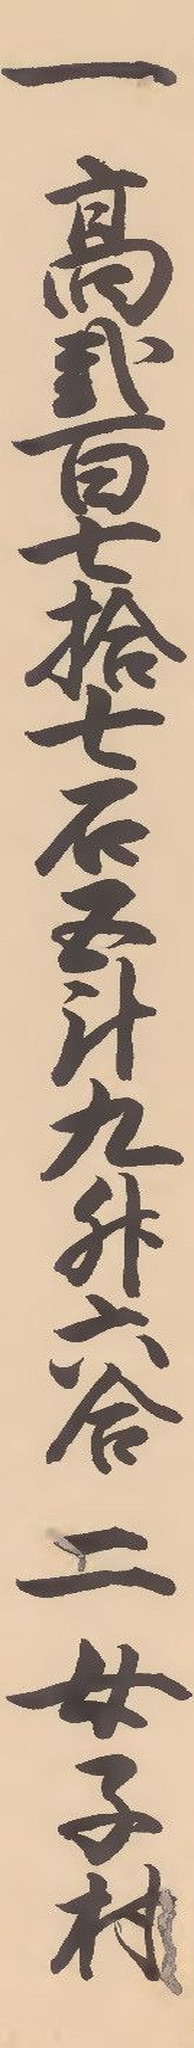一高弐百七拾七石五斗九升六合二女子村
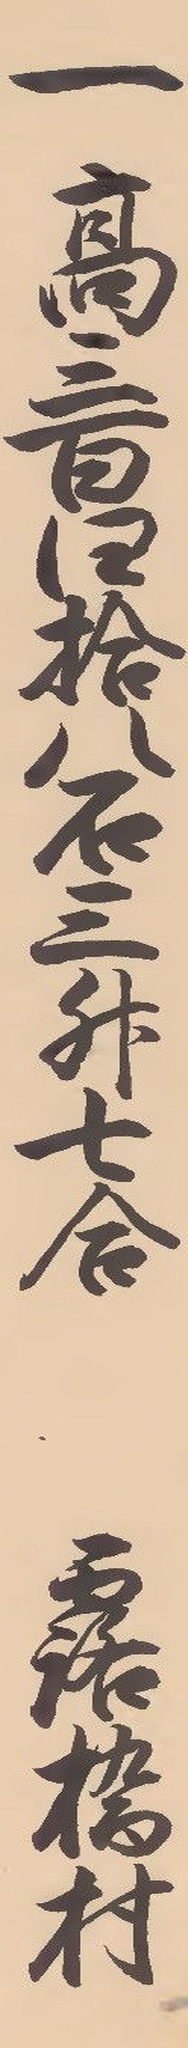一高三百四拾八石三升七合露橋村
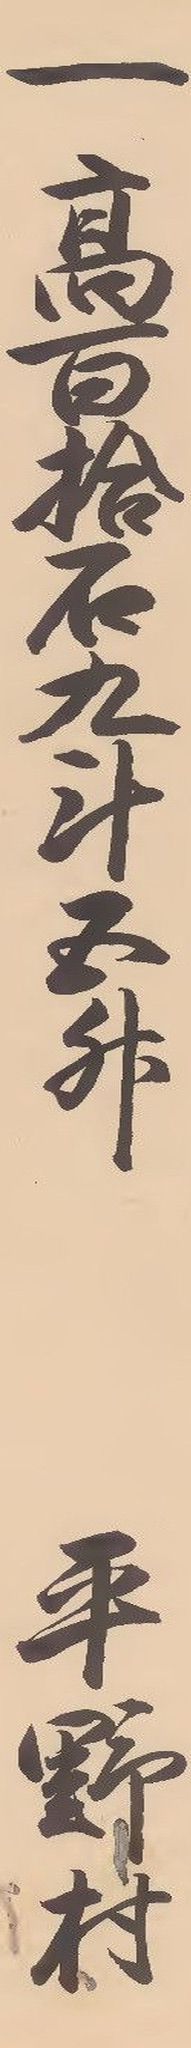一高百拾石九斗五升平野村
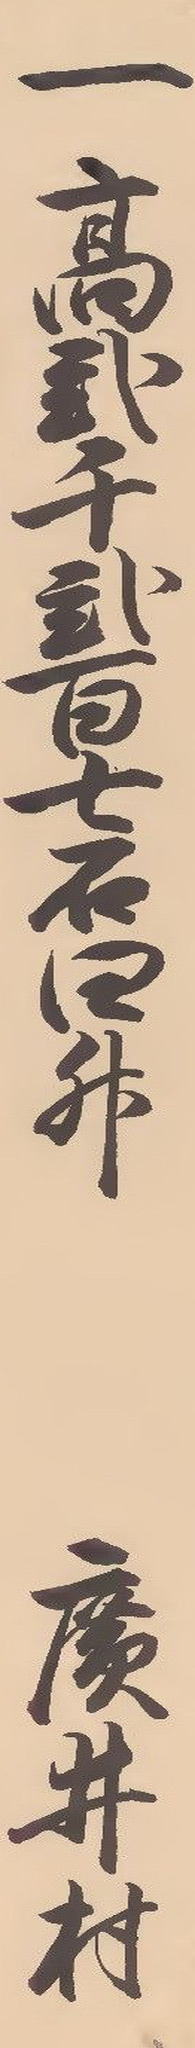一高弐千弐百七石四升広井村
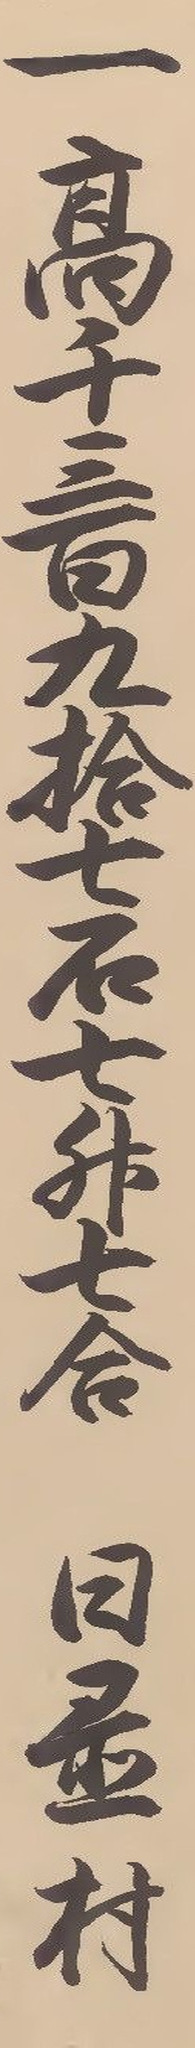一高千三百九拾七石七升七合日置村
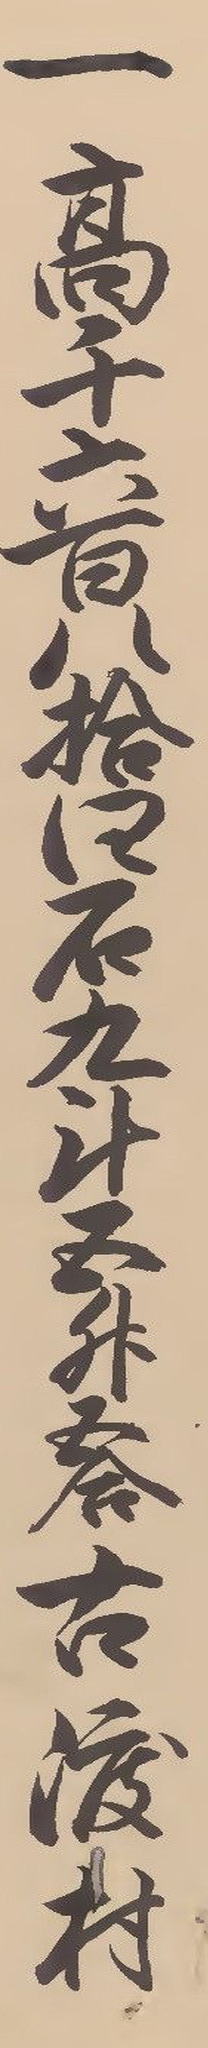一高千六百八拾四石九斗五升五合古渡村
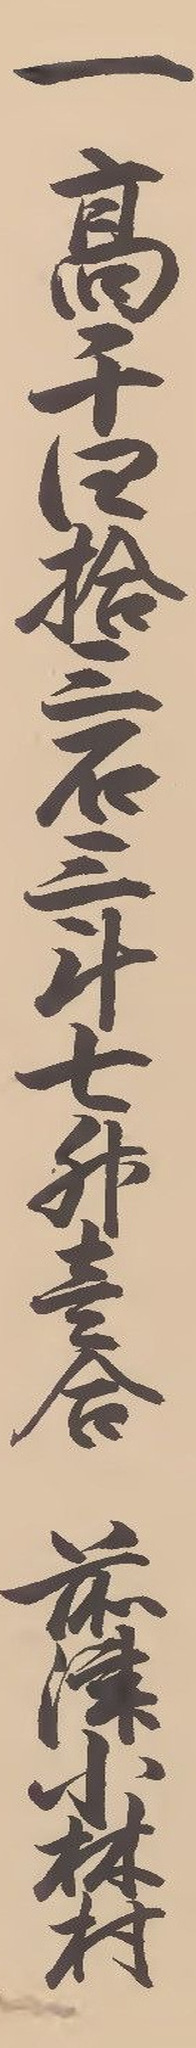一高千四拾三石三斗七升壱合前津小林村
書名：尾張国郷帳
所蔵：国立公文書館 National Archives of Japan
